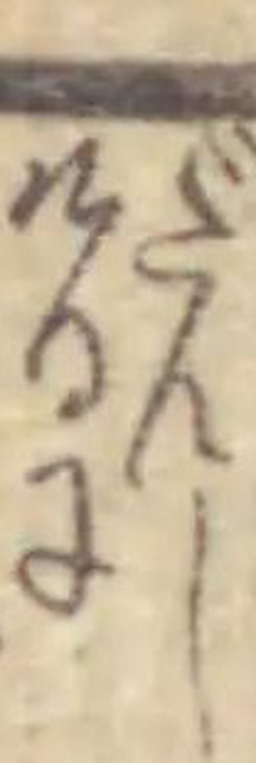けるに
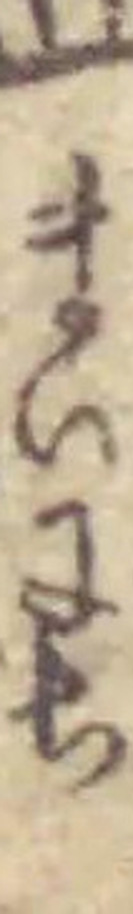まいにち
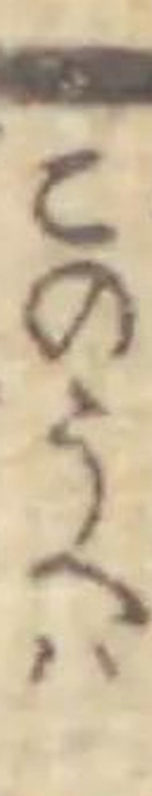このうへは
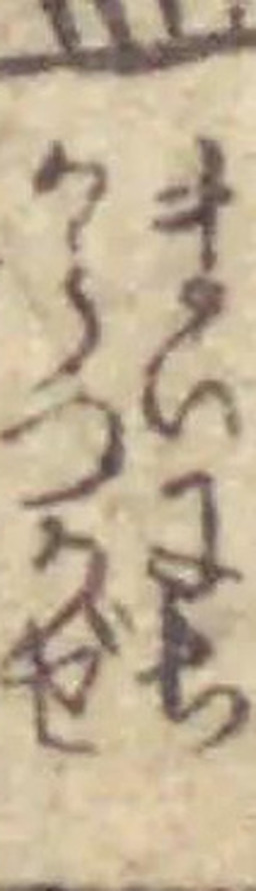からつかぜ
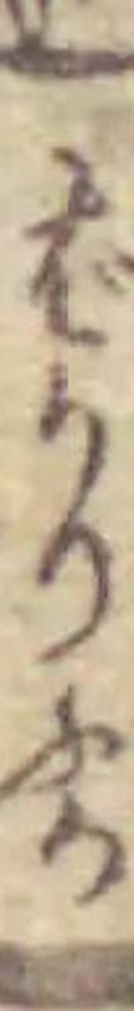ばかりふか
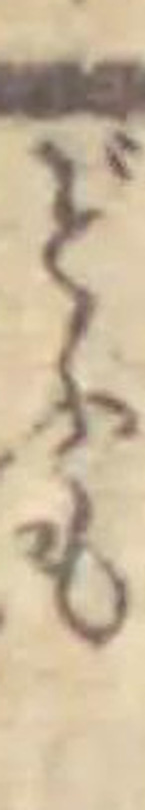どふも
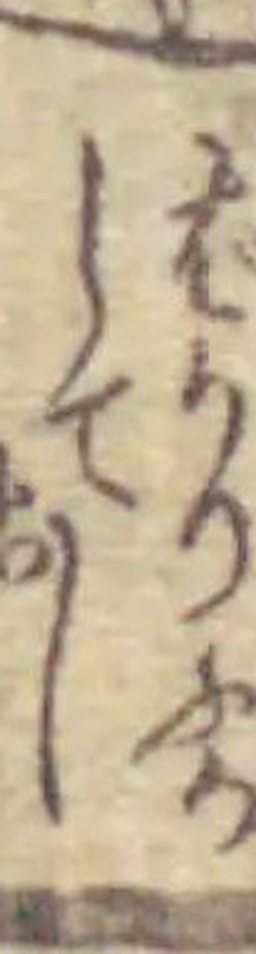しておし
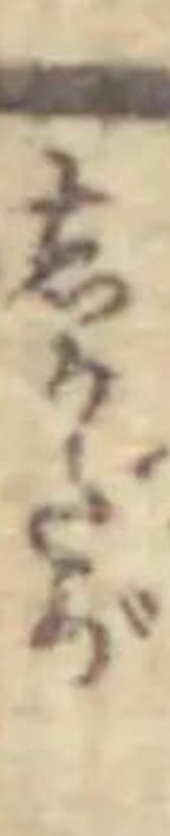しかたが
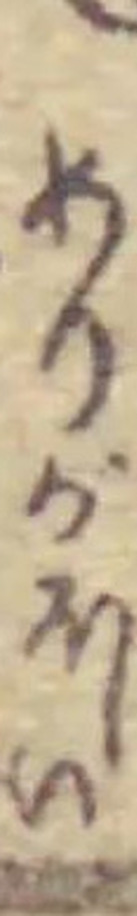めりがほしい
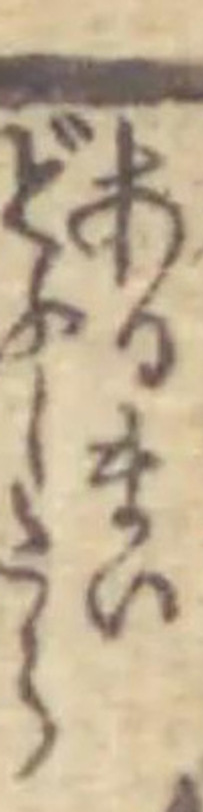どふしたら
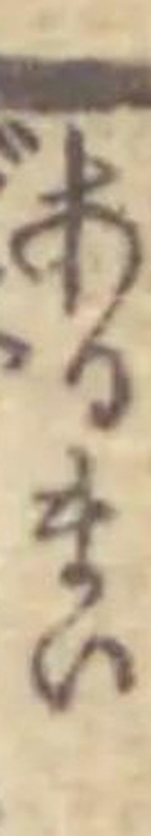あるまい
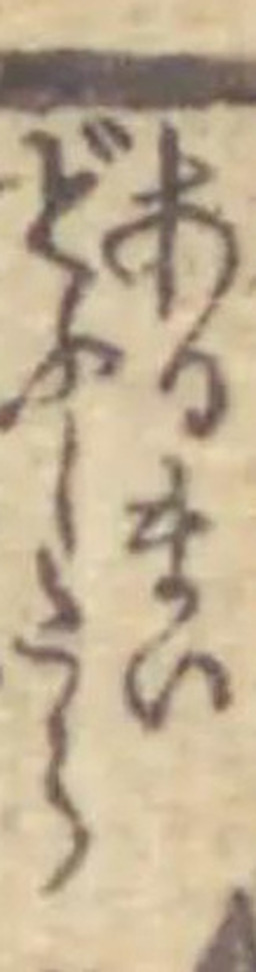どふしたら
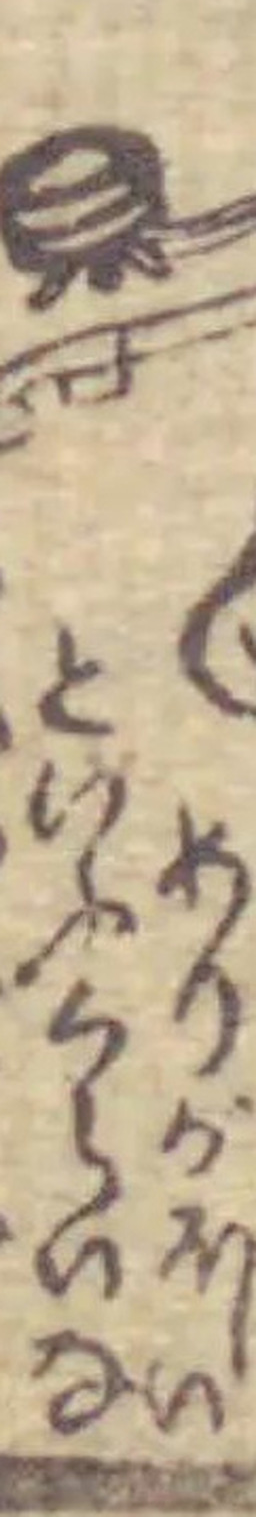といふくらいな
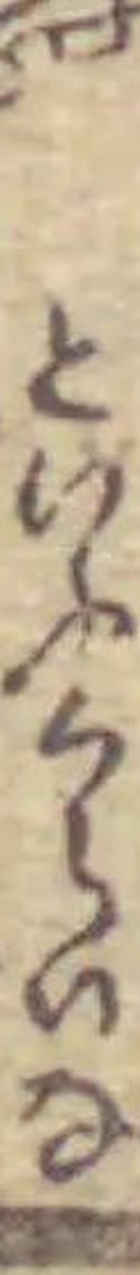といふくらいな
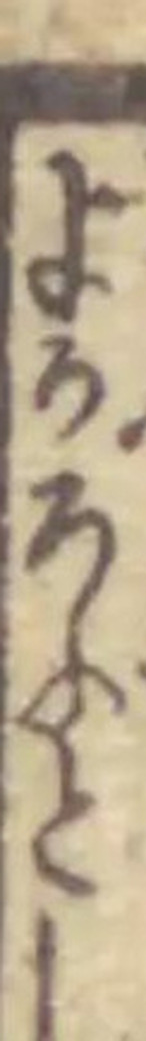よかろふと
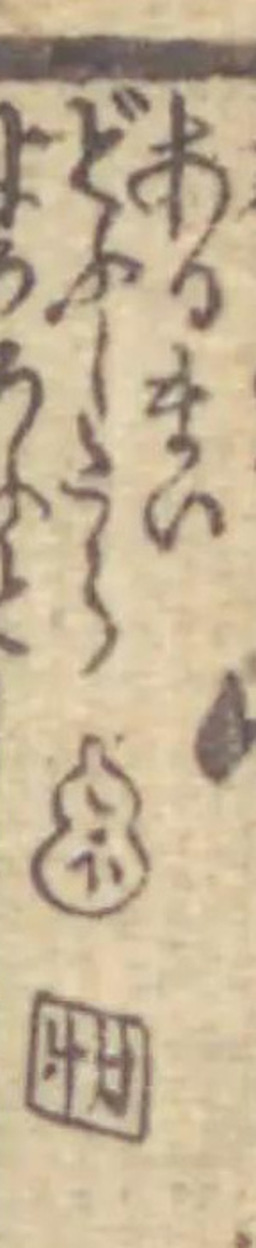どふしたら
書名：雨宮風宮出儘略縁記 3巻
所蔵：国立国会図書館 National Diet Library, JAPAN
